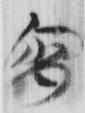宵
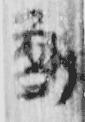戠
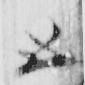之
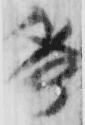秀
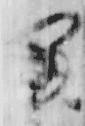泉
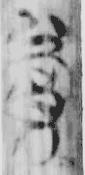賞
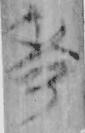秀
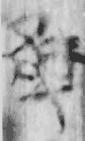雘
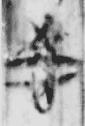志
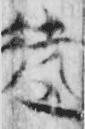遶
